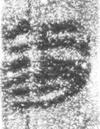番（繙）
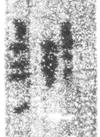芋（紆）
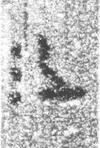之
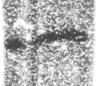一
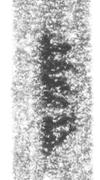番（繙）
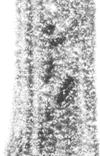芋（紆）
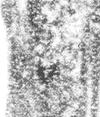之
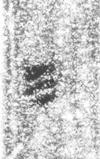丹
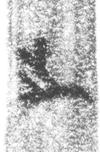之
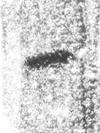一
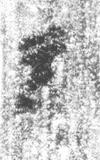○（圓）
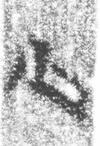少
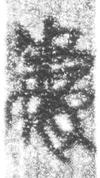襄（囊）
